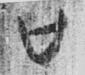口
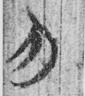勿
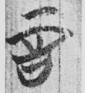言
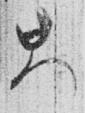也
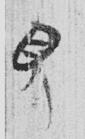視
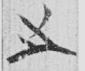之
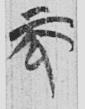而
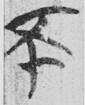不
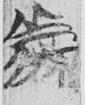義
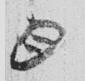目
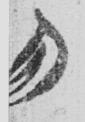勿
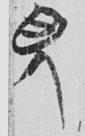視
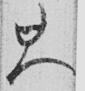也
